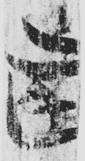市
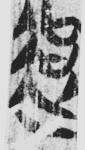○（驅）
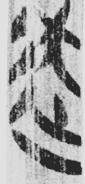迖（逐）
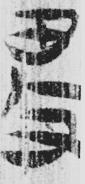畋（獵）
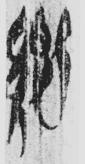○（弋）
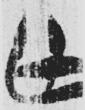亡（無）
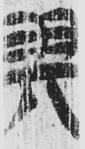○（期）
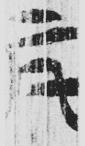○（度）
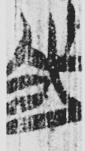或（又）
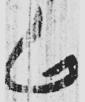㠯（以）
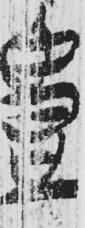○（豎）
